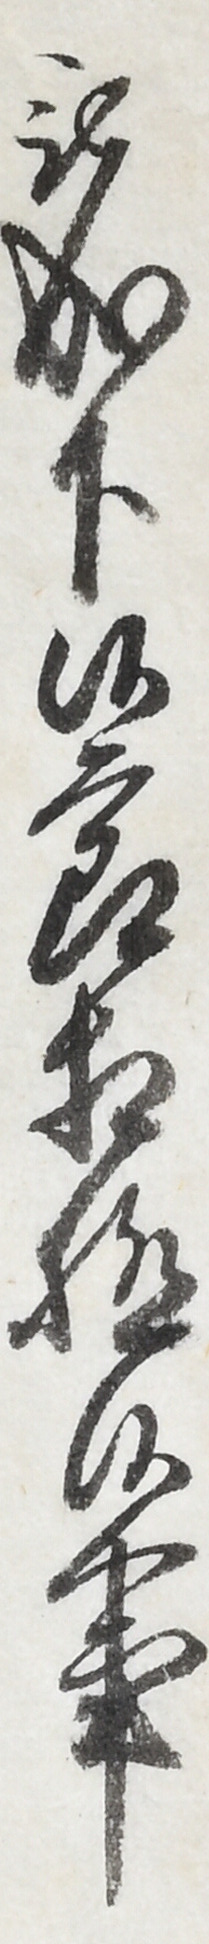被成下候節相極候事
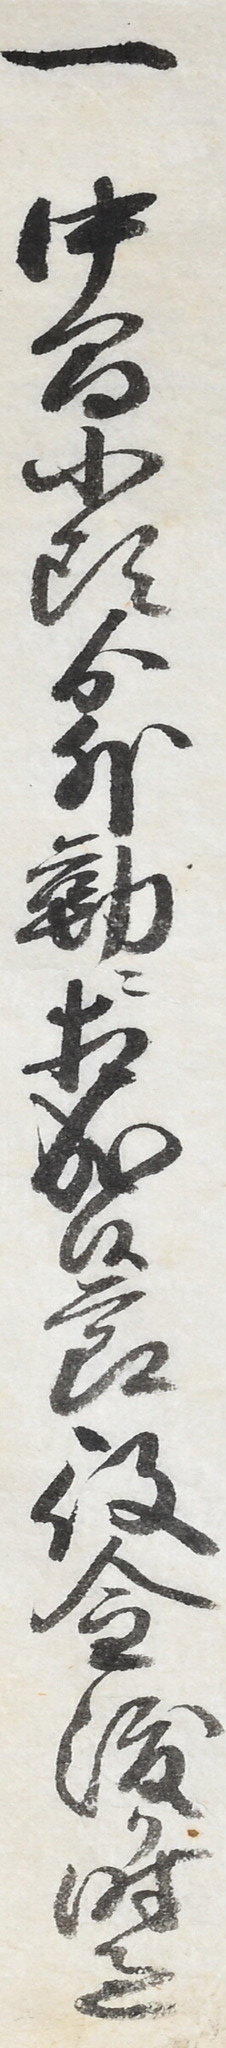一中間小頭ゟ外勤ニ相成候節役金渡リ時迄
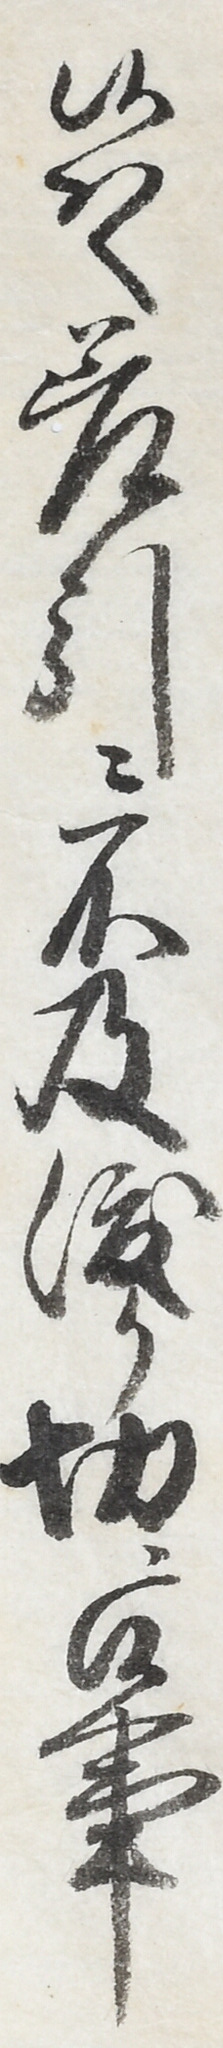候ハヽ差引ニ不及渡リ切ニ候事

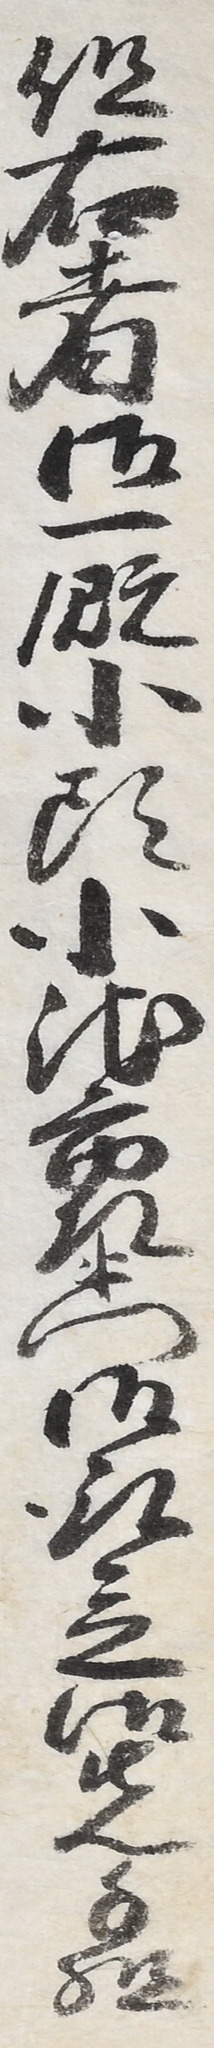但右は御厩小頭小池市左衛門御取立御先手組
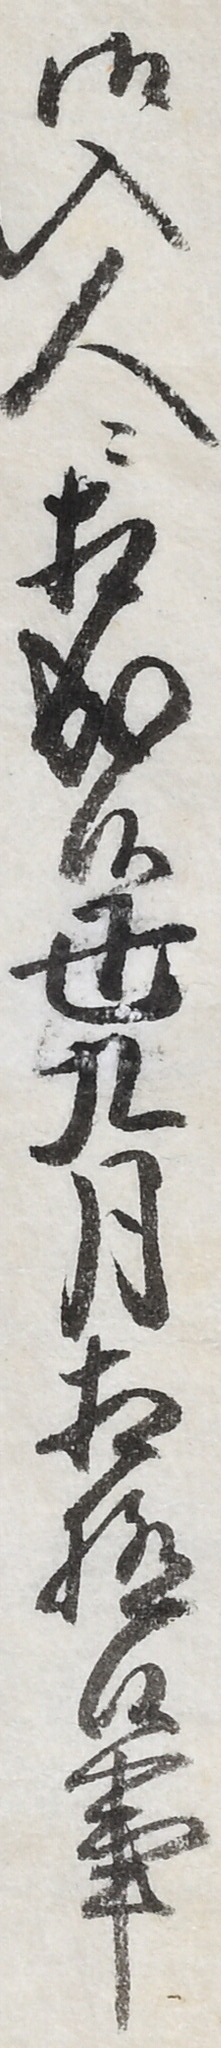御入人ニ相成候丑九月相極候事
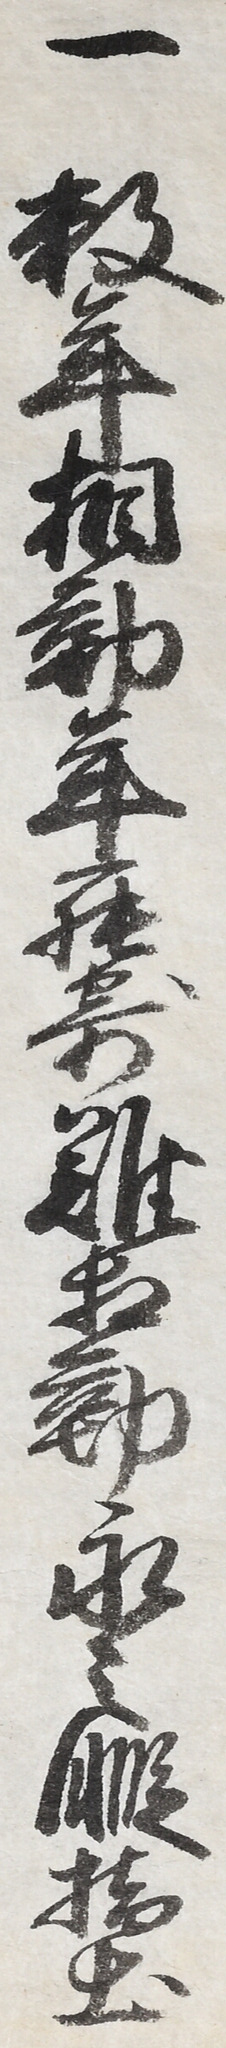一数年相勤年罷寄難相勤永々暇指出
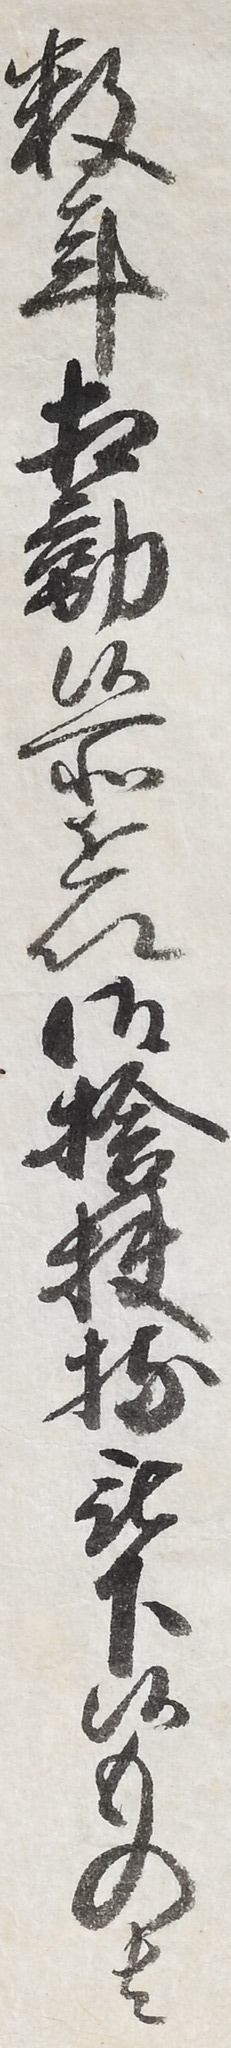数年相勤候所を以御捨扶持被下候ものは
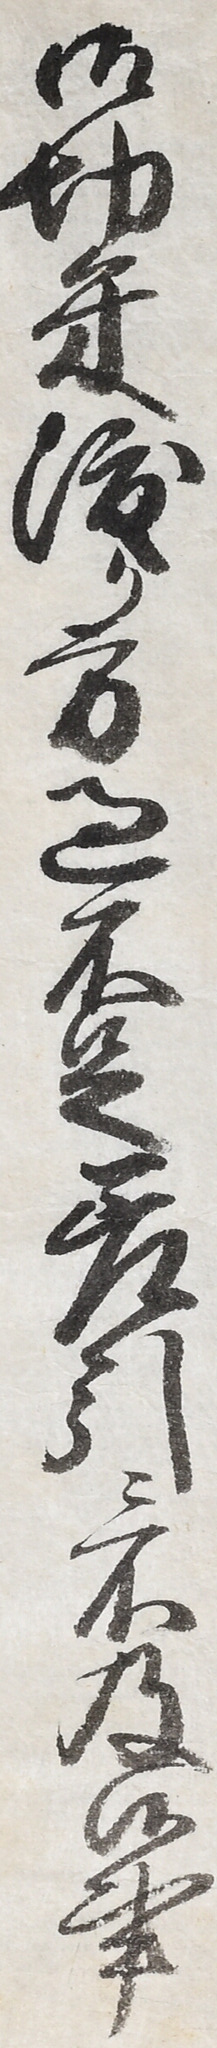御切米渡リ方過不足差引ニ不及候事
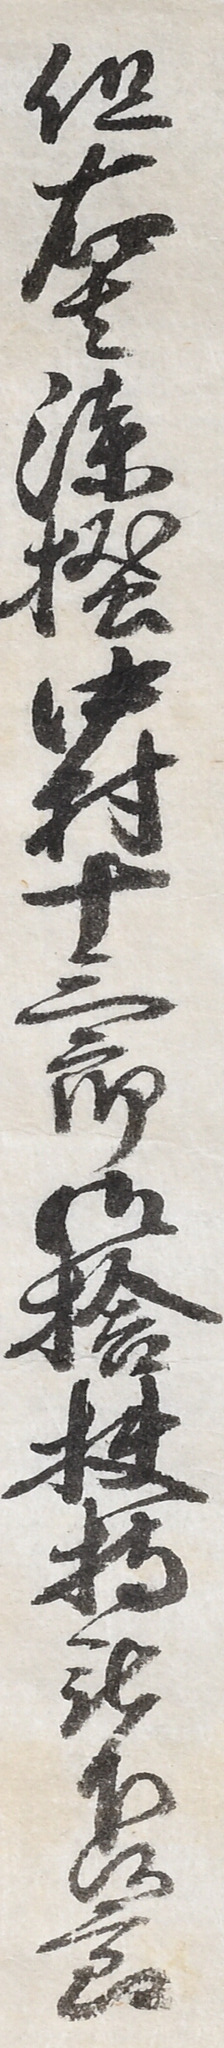但右は漆揆中村十三郎御捨扶持被下候節
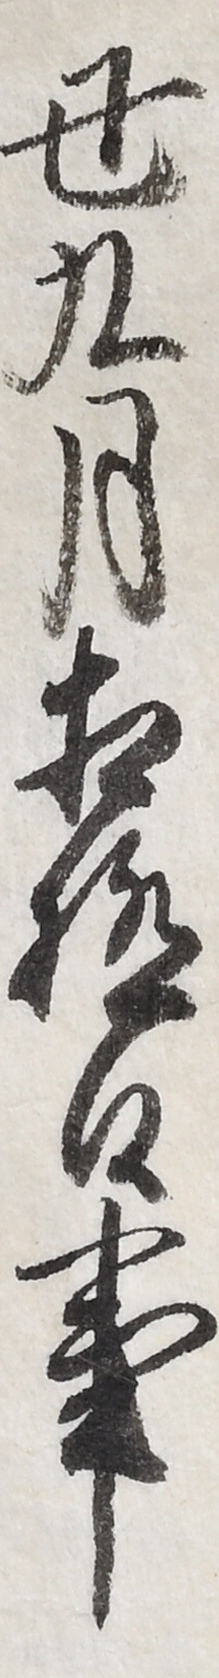丑九月相極候事
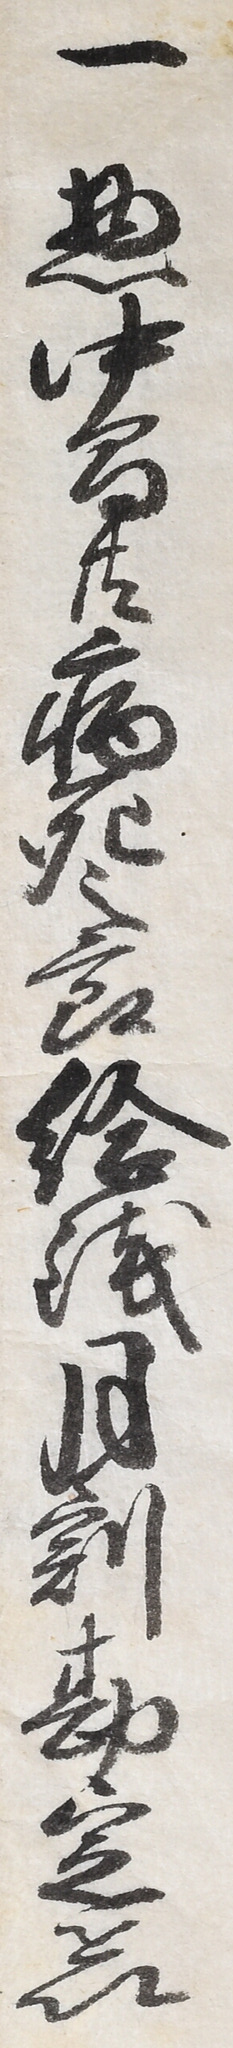一惣中間共病死之節給銭月割勘定を以
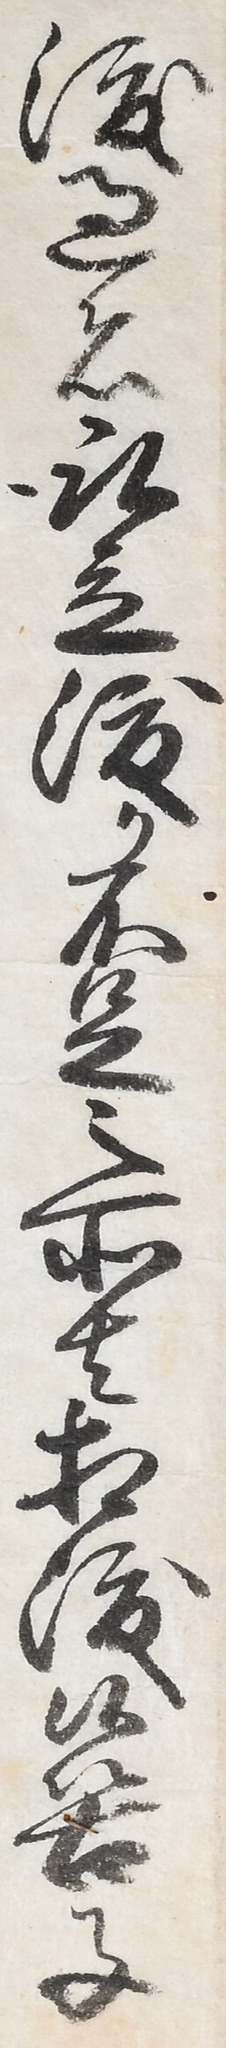渡過は取立渡リ不足之所は相渡候筈子
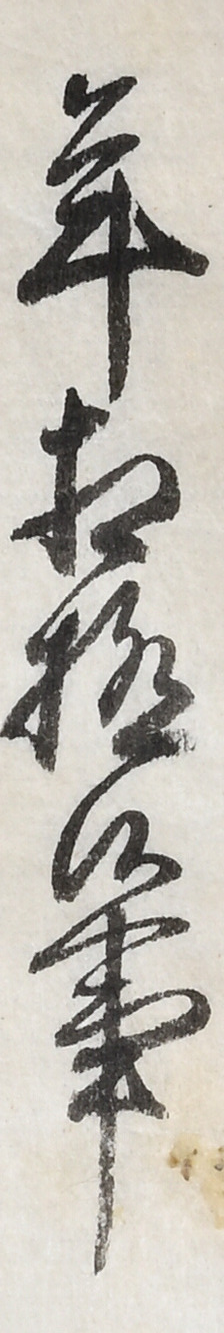年相極候事
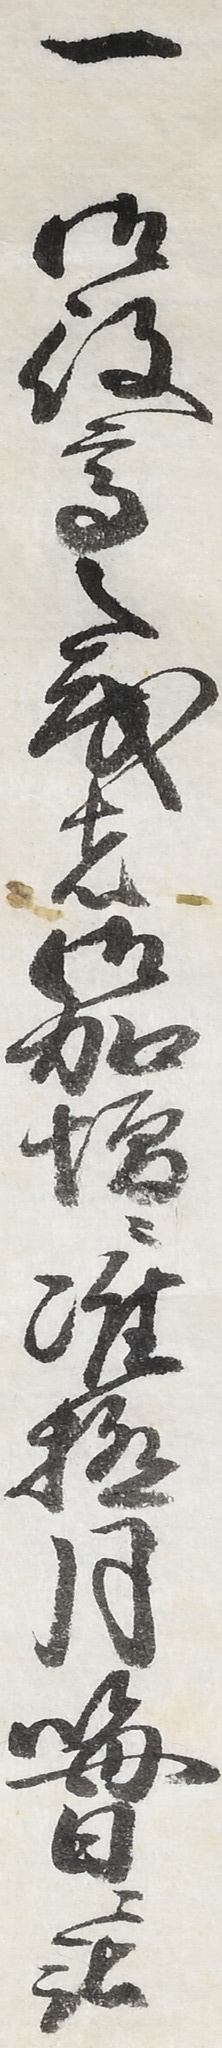一御役高之義は御加増ニ准極月晦日ニ被
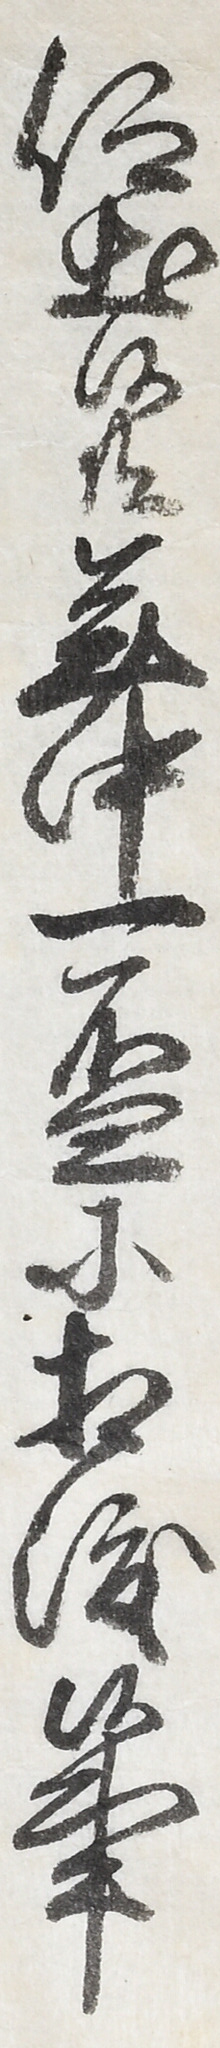仰出候共年中一盃に相渡候事
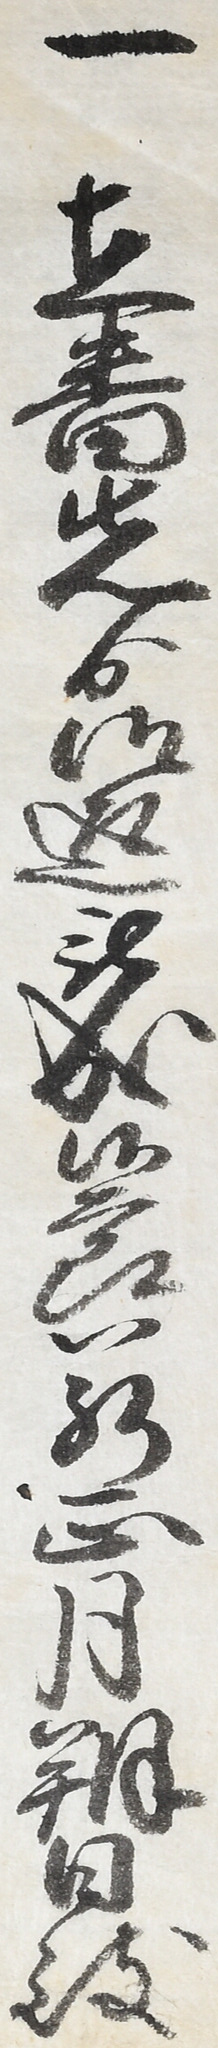一在番先ゟ御返被成候節若正月朔日致
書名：御給分渡り方定追加
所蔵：伊那市立高遠町図書館・合同会社AMANE
